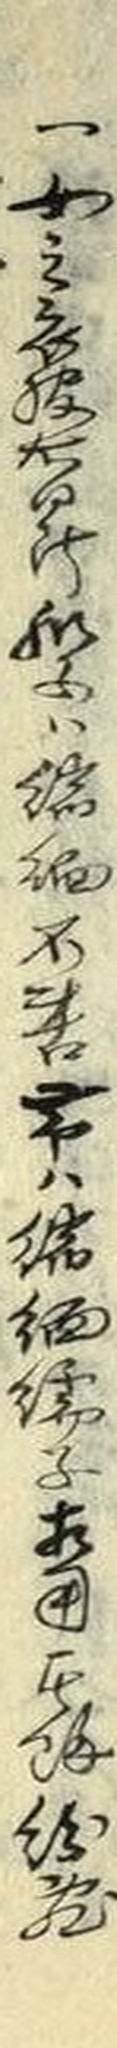一女之衣服右同断肌子ハ縮緬不苦帯ハ縮緬繻子相用其余紛敷
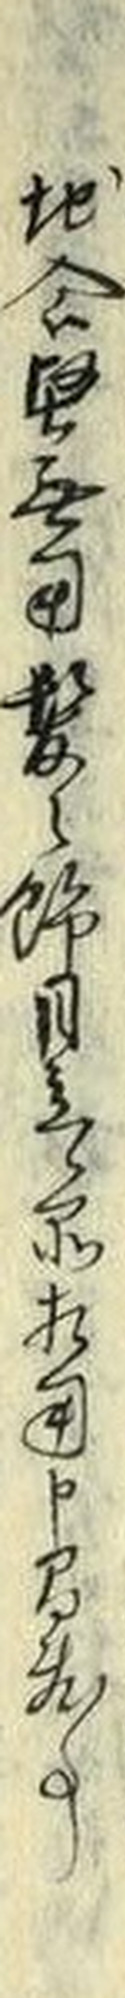地合堅無用髪之飾目立候品相用申間敷事
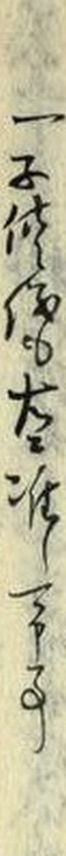一子供之儀も右ニ准シ可申事
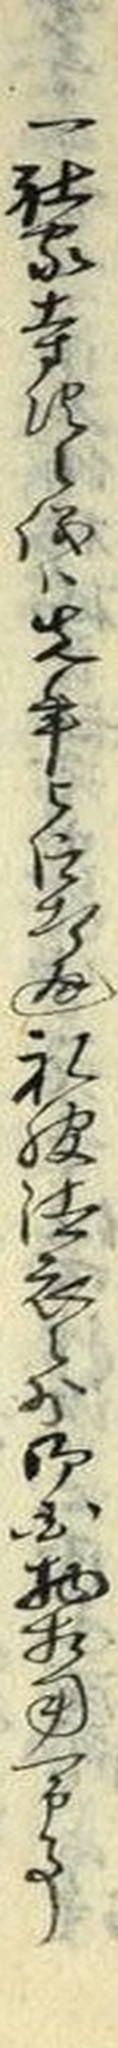一社家寺院之儀ハ先年被仰出候通礼服法衣之外御国物相用可申事
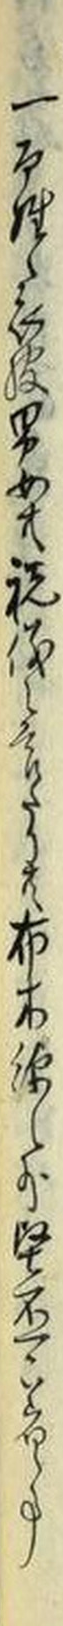一百姓之衣服男女共祝儀之節たり共布木綿之外堅不可着事
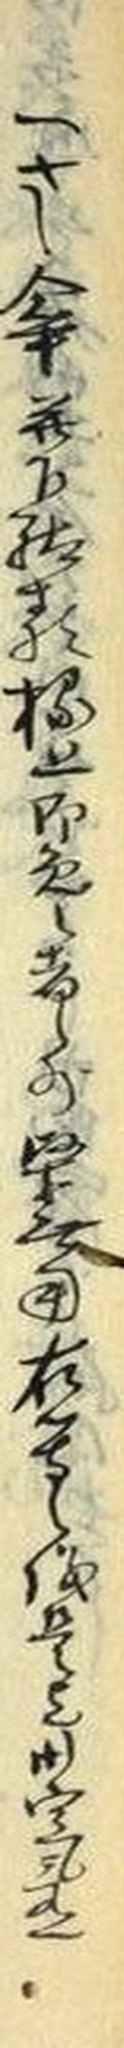一さし傘幷下駄類縁上御免之者之外堅無用右等之儀是迄御定書有
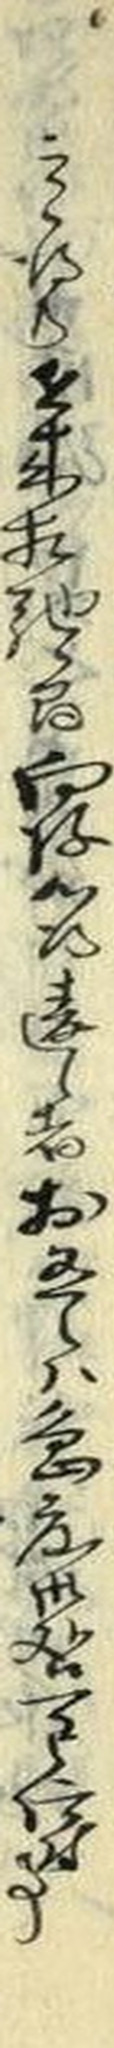之候得共近来相弛候間向後心得違之者於有之ハ急度御咎可被仰付事
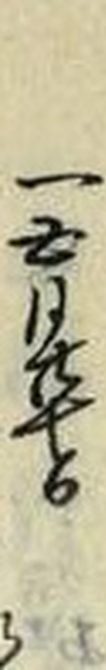一五月廿七日
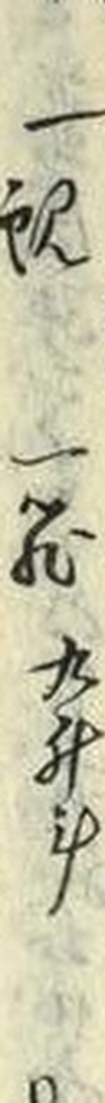蜆一籠九升斗同
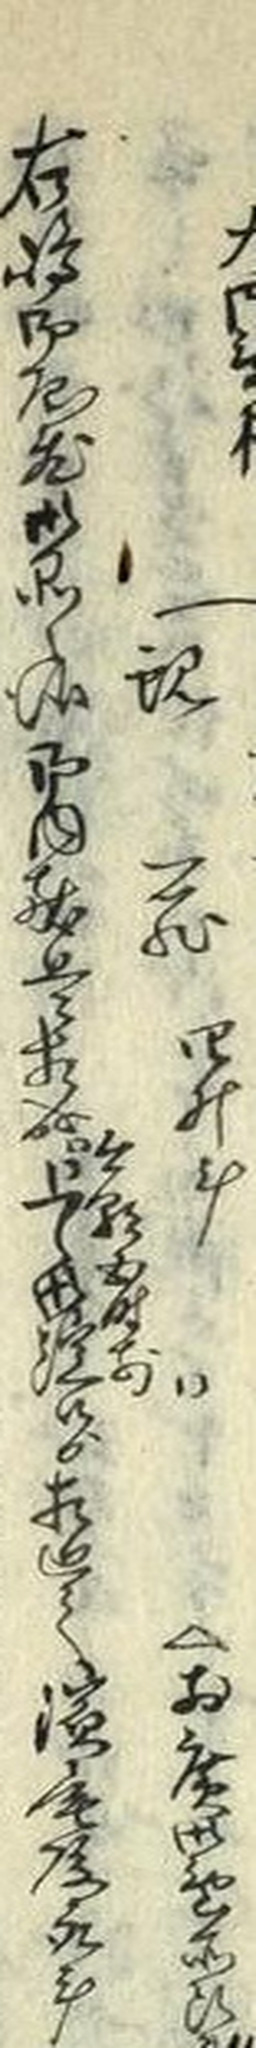右嶋御屋敷御品之趣御内献上ニ相成今朝五時前上之御錠口ゟ相廻之浜尾殿取計
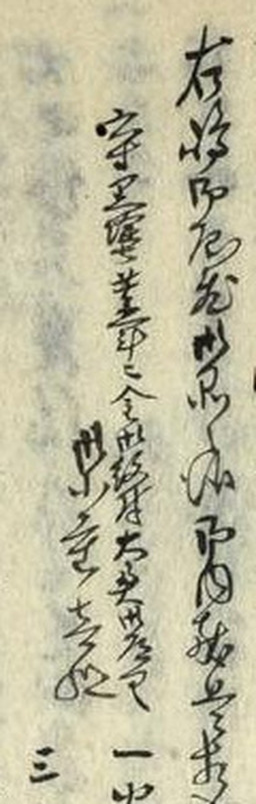六寸黒塗蓋斗ニ金御紋付大奥御道具
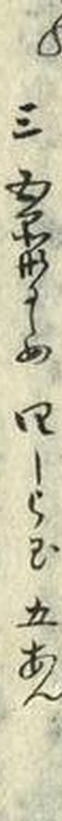三五品御にしめ四しら玉五あん
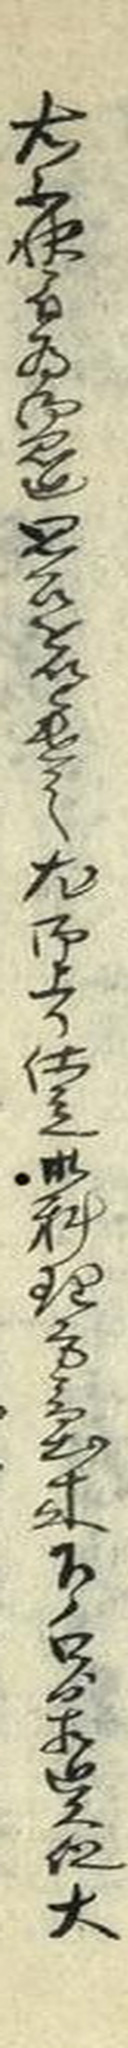右不快ニ付為御見廻思召を以被遣之尤御上り仕立御料理方ニ而出来下ノ口ゟ相廻ス但大
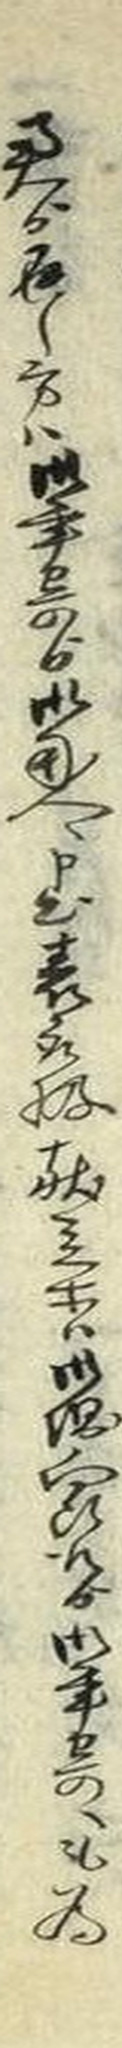奥ゟ通し方ハ御年寄ゟ御用人へ申出表取扱献立等ハ御側向頭取ゟ御年寄へも為
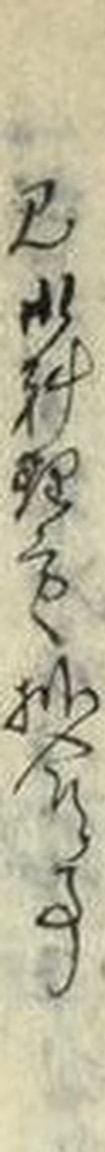見御料理方へ掛合候事

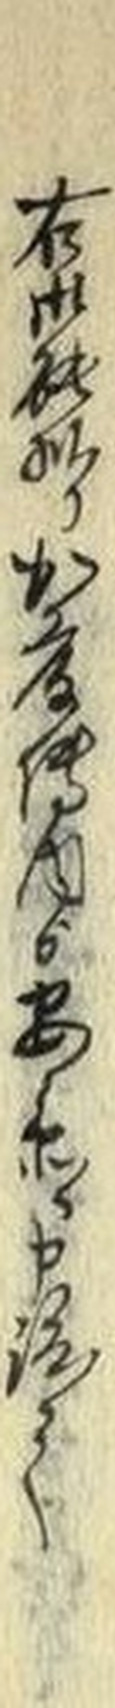右御能掛り加藤伝内ゟ安兵衛へ申渡之
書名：少傅日録抄（斉善付側向頭取日記、在府）
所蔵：福井県文書館 Fukui Prefectural Archives
